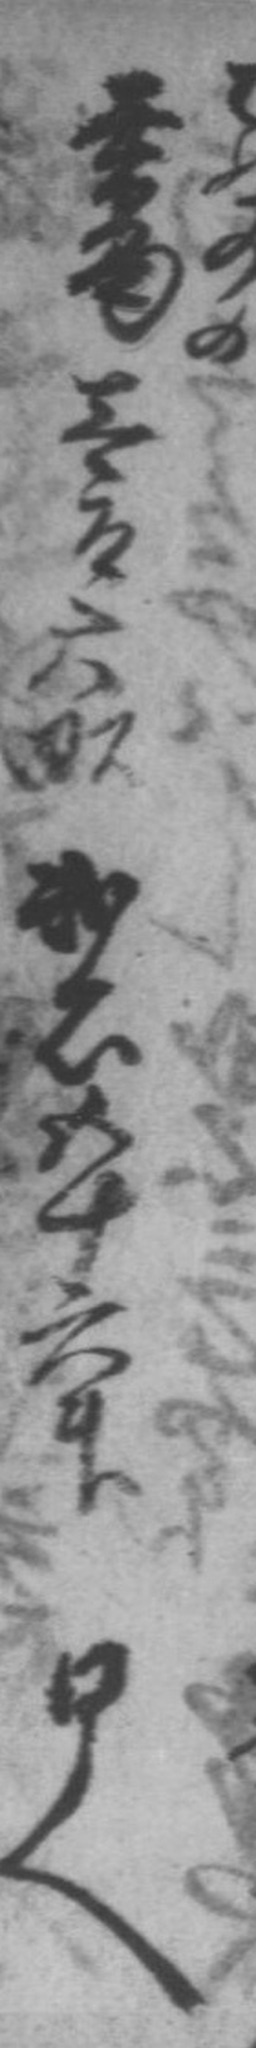桑畠壱反六畝弐石五斗六升同人

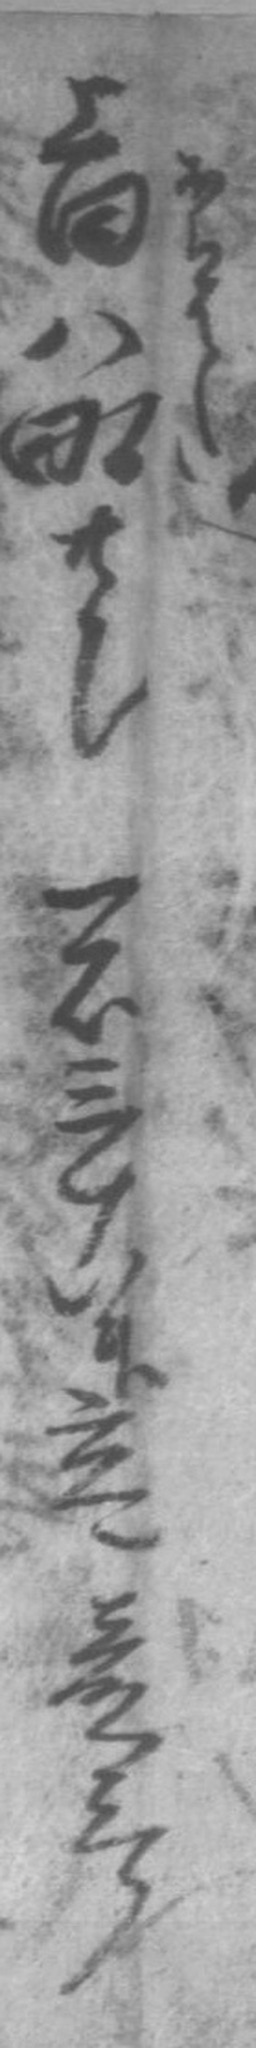上田八畝廿分一石三斗八升六合彦三郎
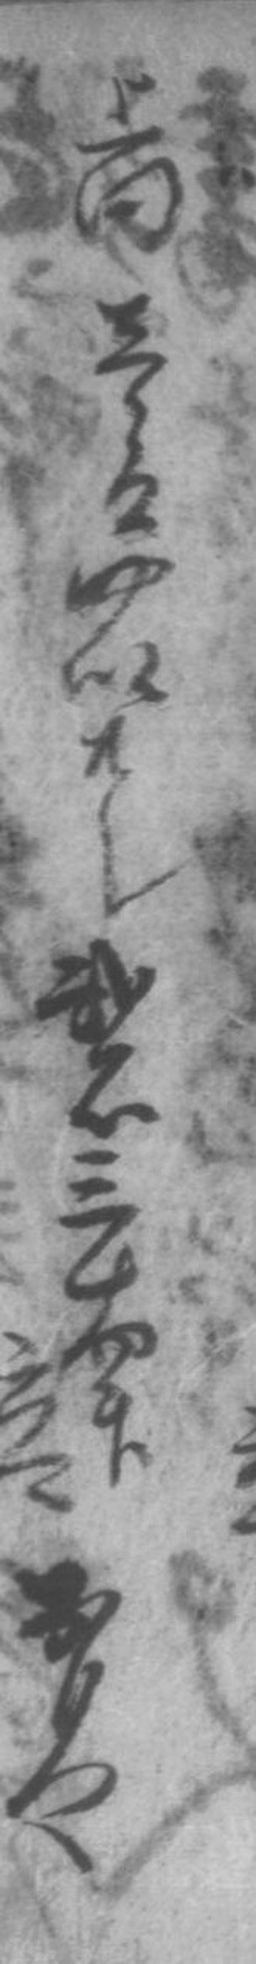上田壱反四畝廿分弐石三斗四升六合おりや
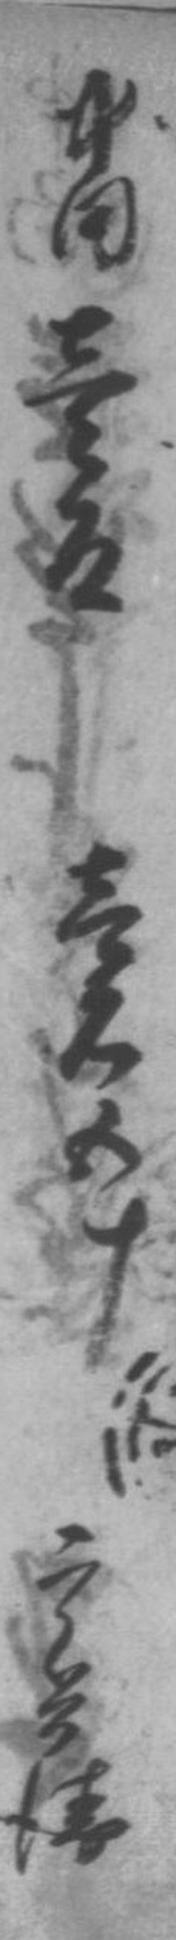中田壱反壱石五斗二郎兵衛
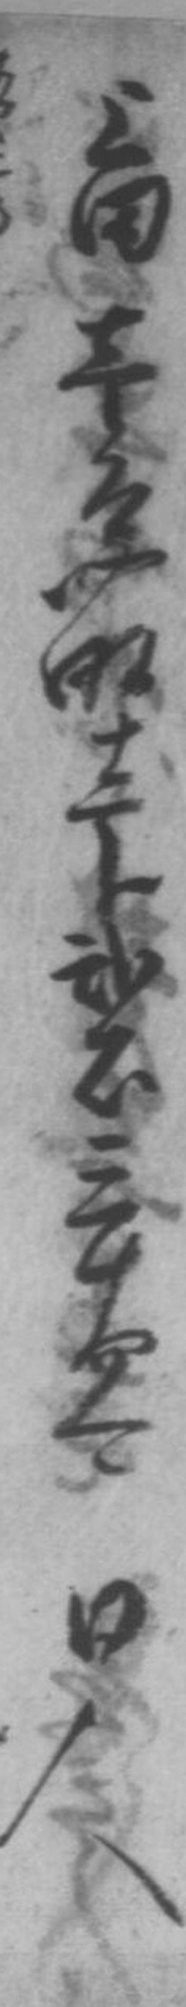上田壱反四畝十二分弐石三斗四合同人
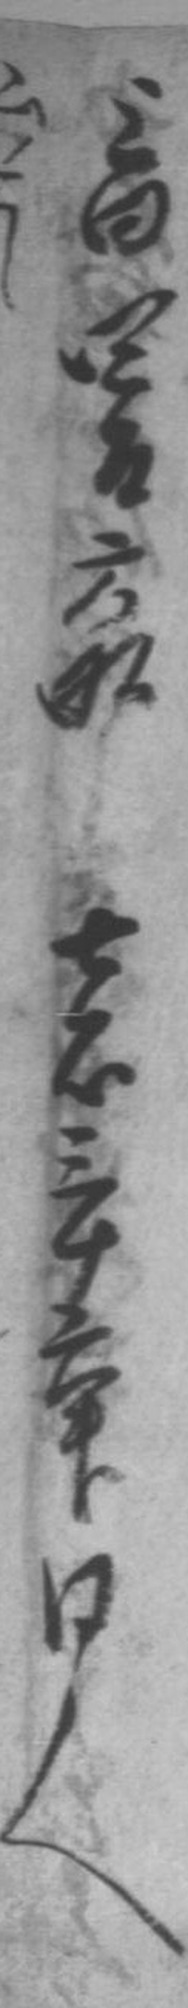上田四反六畝七石三斗六升同人
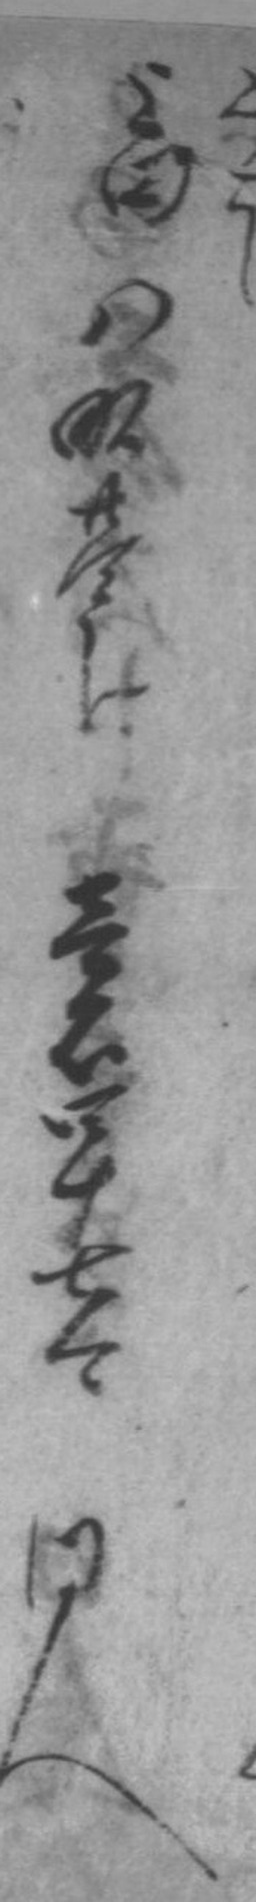上田八畝廿四歩壱石四斗七合同人
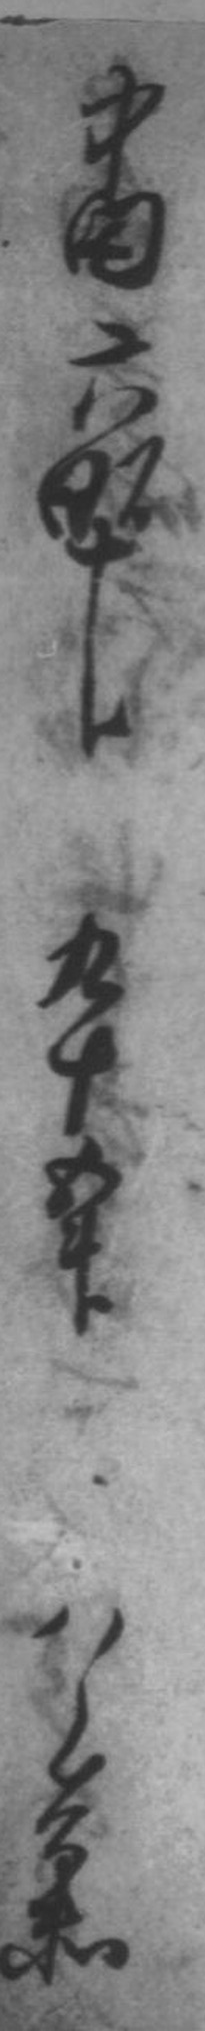中田六畝十分九斗五升八兵衛

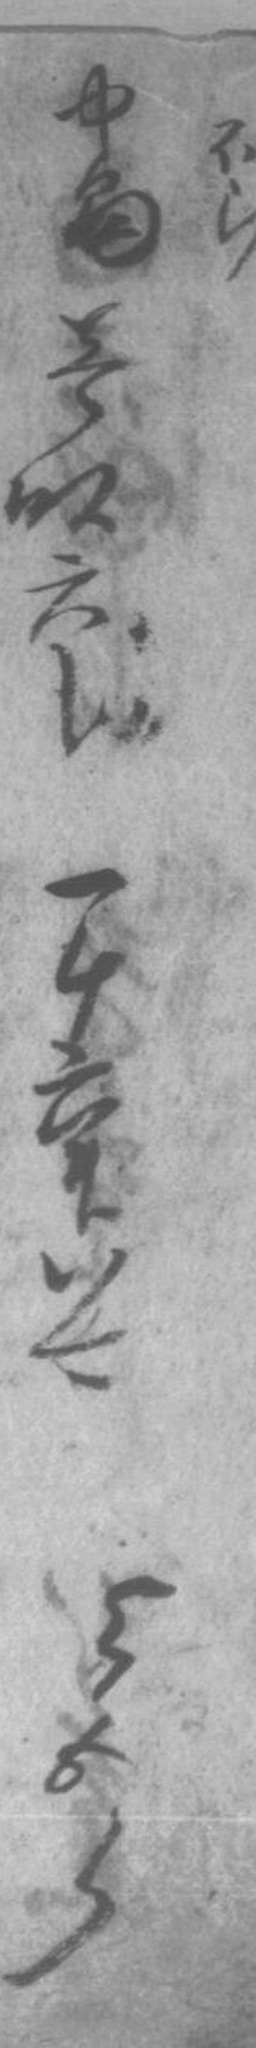中畠壱畝六分一斗六升八合与五郎
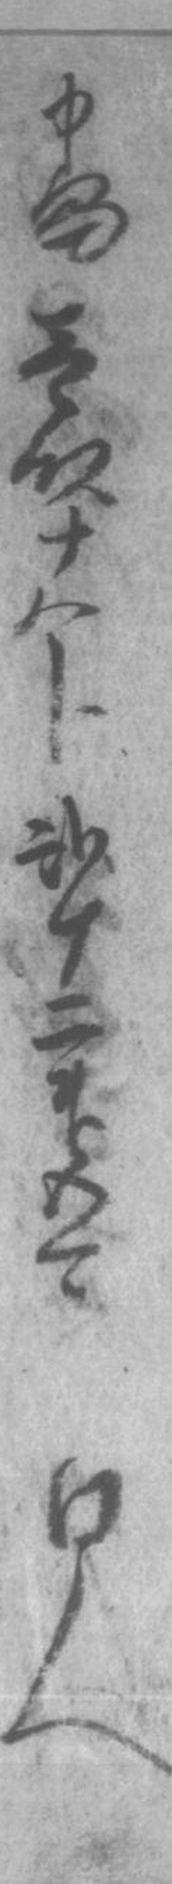中畠壱畝十八分弐斗二升五合同人
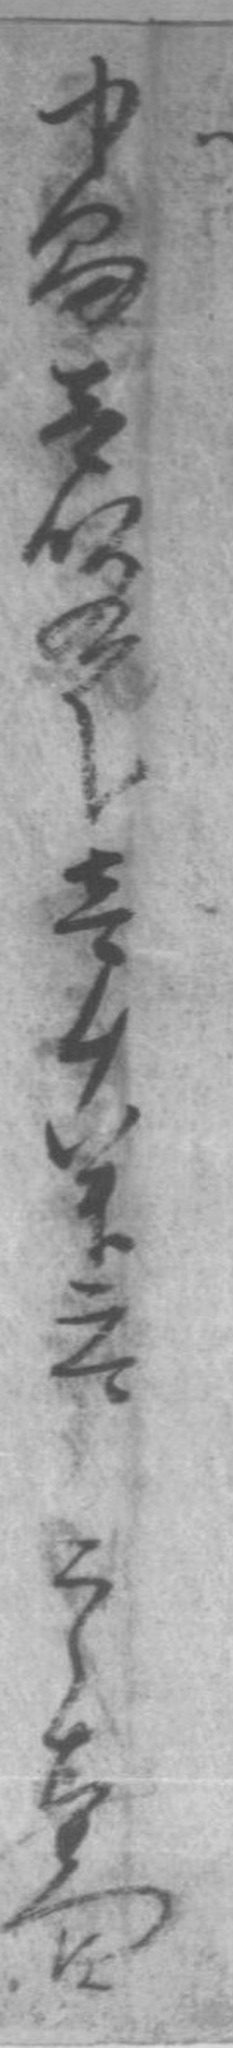中畠壱畝九分壱斗八升二合二郎左衛門
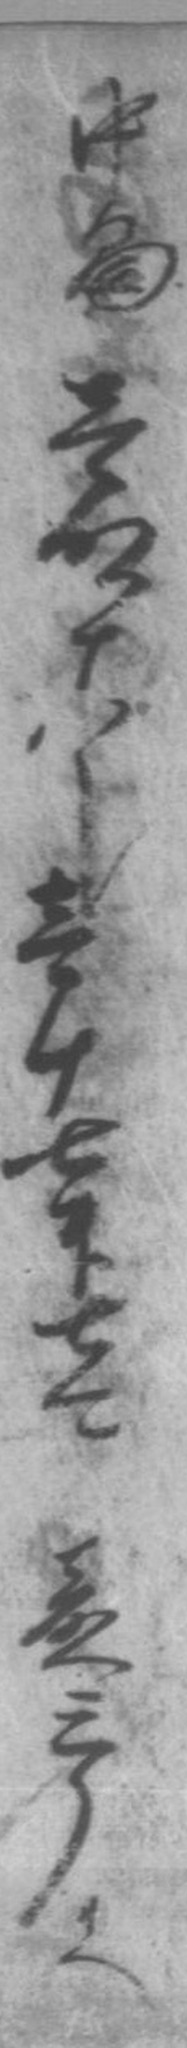中畠壱畝十八分壱斗七升七合彦三郎
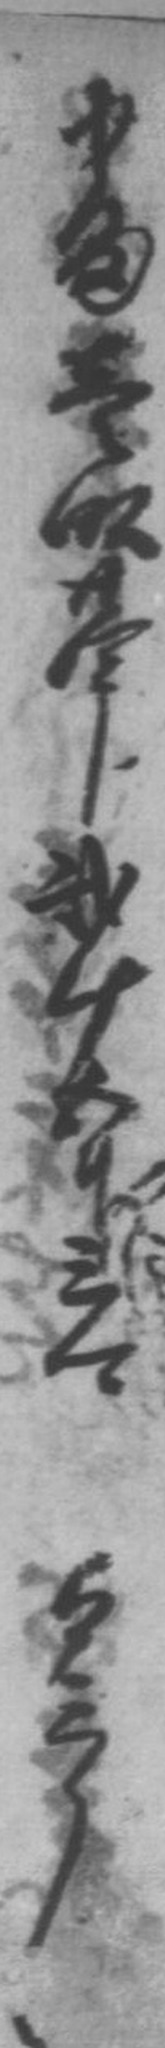中畠壱畝廿四分弐斗五升三合与三郎
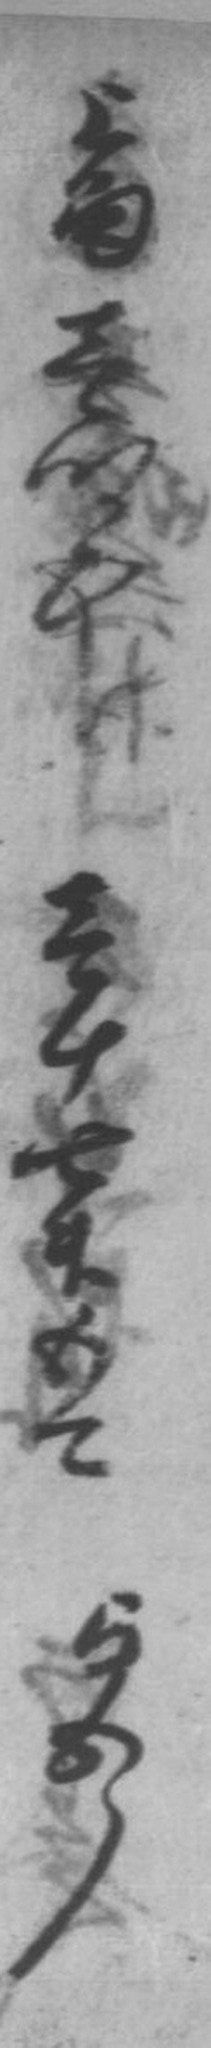上畠壱畝五分壱斗七升五合与五郎
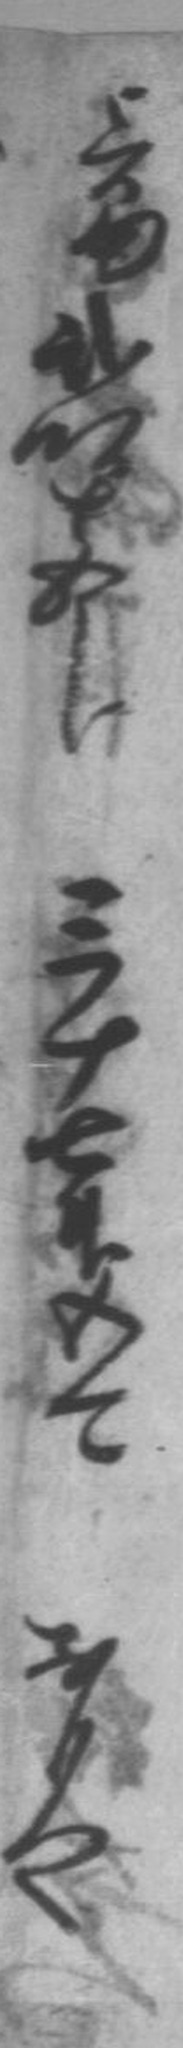上畠弐畝十五分三斗七升五合おりや
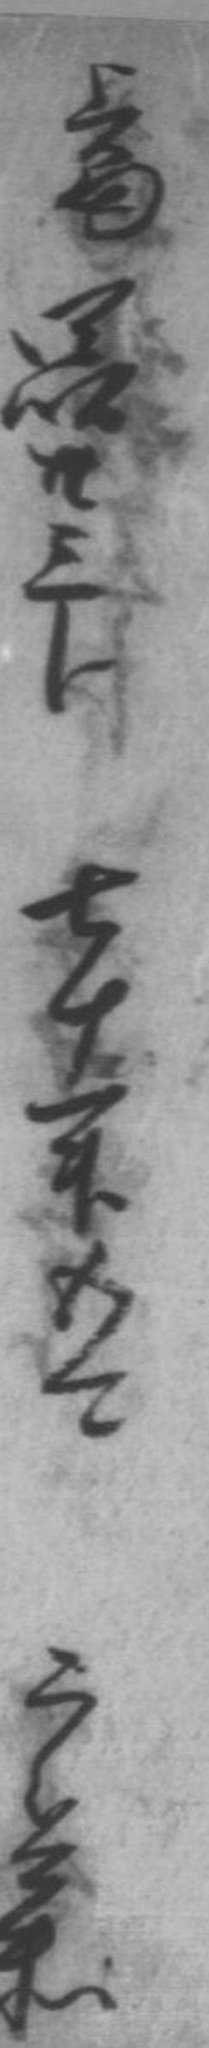上畠四畝廿三分七斗一升五合二郎兵衛
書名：越州大野郡ノ内不動堂村御検地帳
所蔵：福井県文書館 Fukui Prefectural Archives
